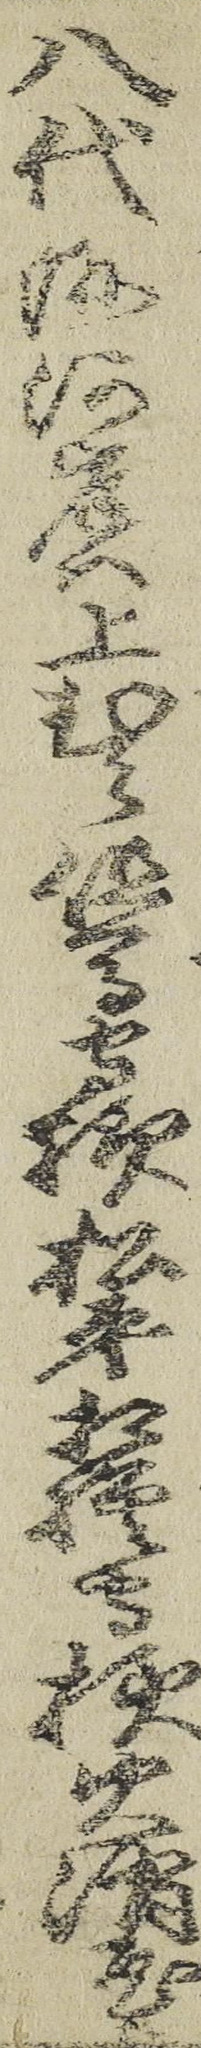八代洲河岸は上むら但馬守様松平相模守様火消屋
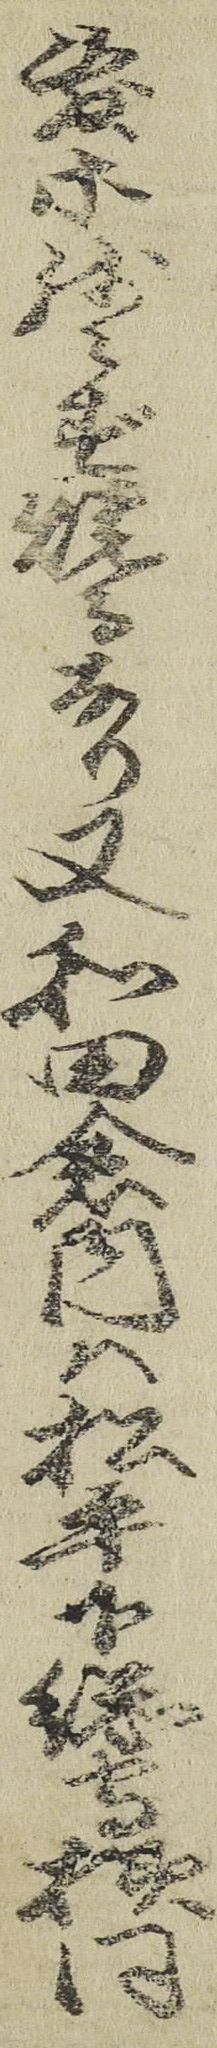敷等残らず焼るなり又和田倉内は松平下総守様同
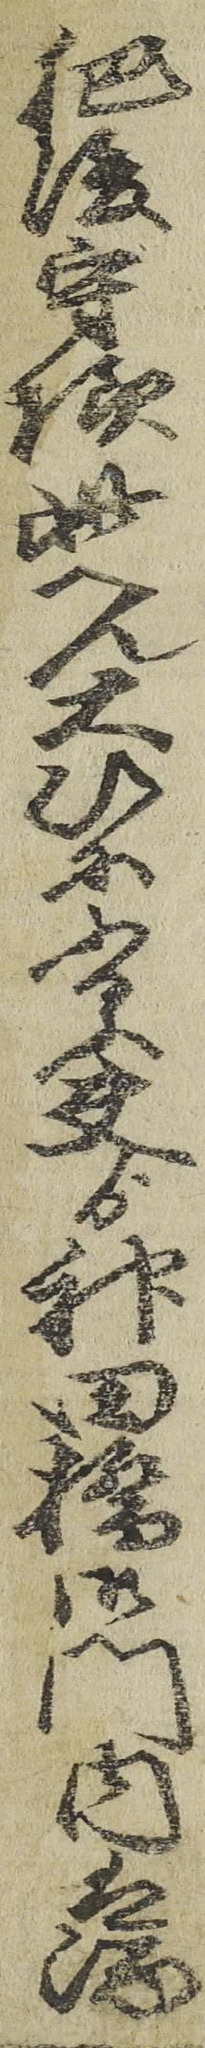肥後守様此へん大ひにふるふ夫ゟ神田橋御門内は酒

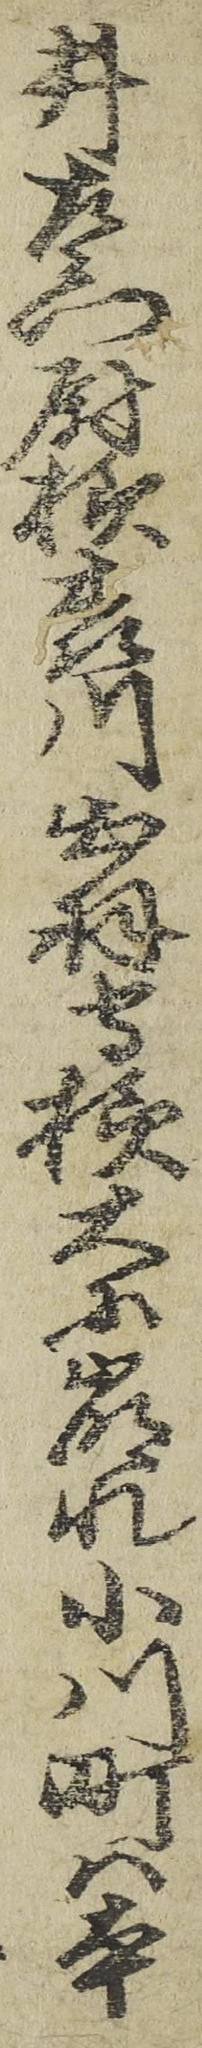井左衛門尉様森川出羽守様大に崩れ小川町は本
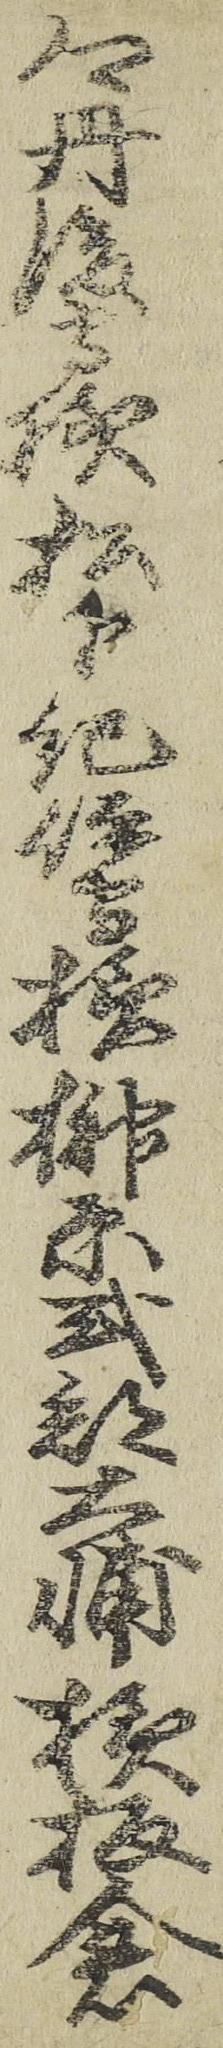郷丹後守様松平肥後守様榊原式部大輔様板倉
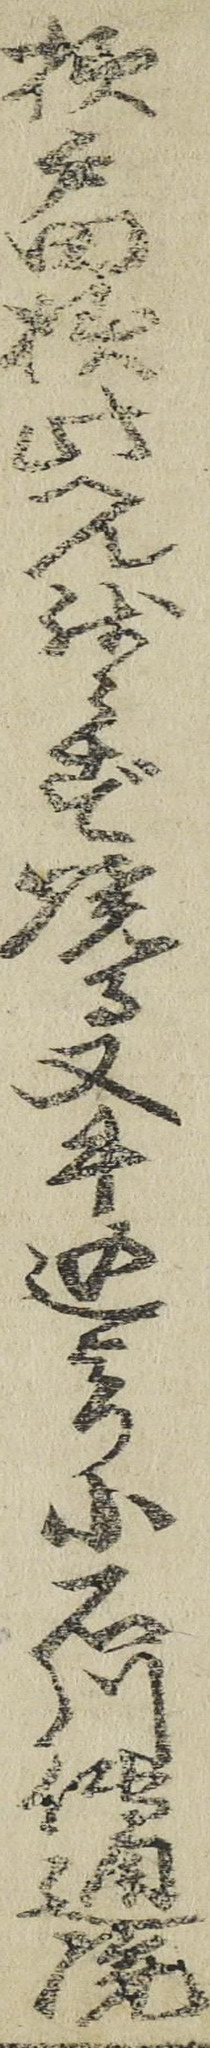様戸田様此へん残らず焼る又牛込より小石川伝通院
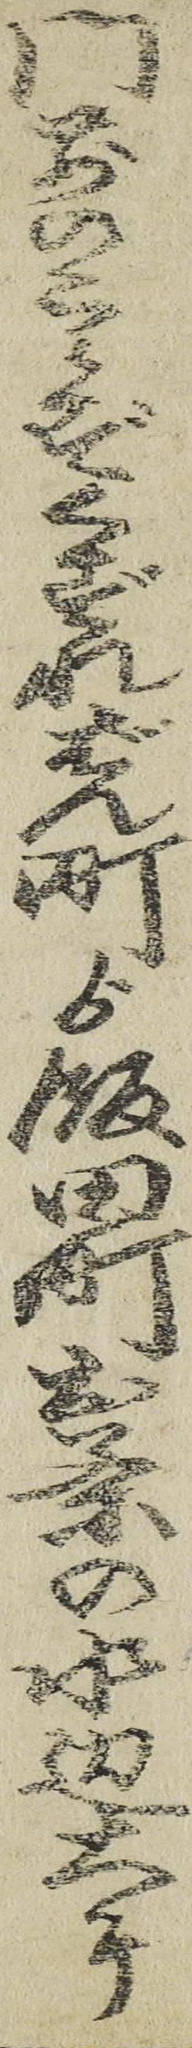門前のこらずくずればん町ゟ飯田町お茶の水辺大に
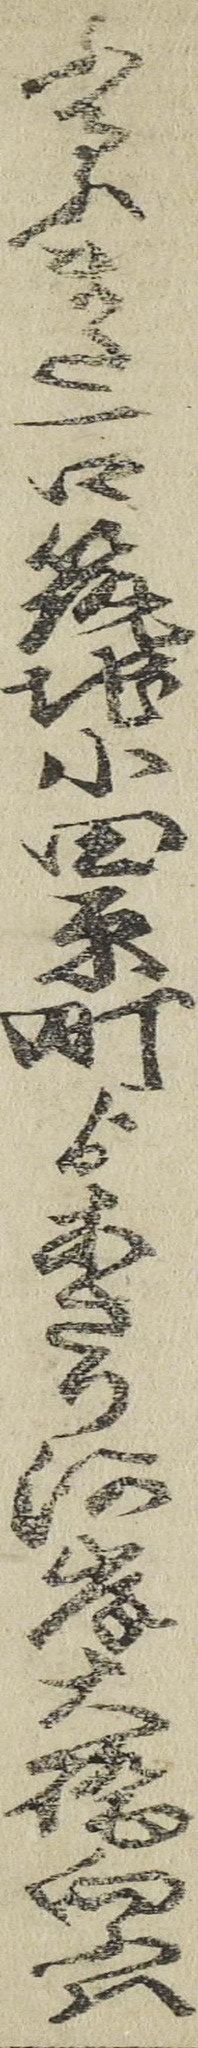ふるふまた一口築地小田原町ゟあさり河岸大橋向ふは
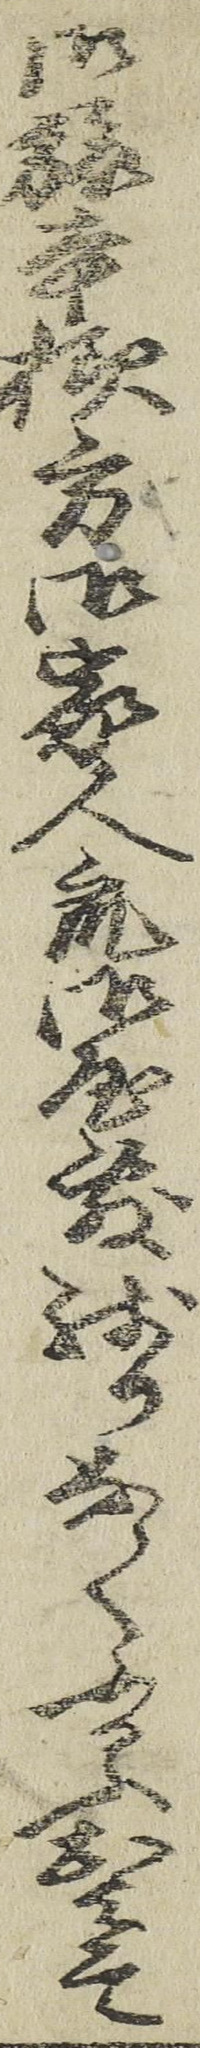御籏本様方御家人衆御屋敷残なくふるふおよそ
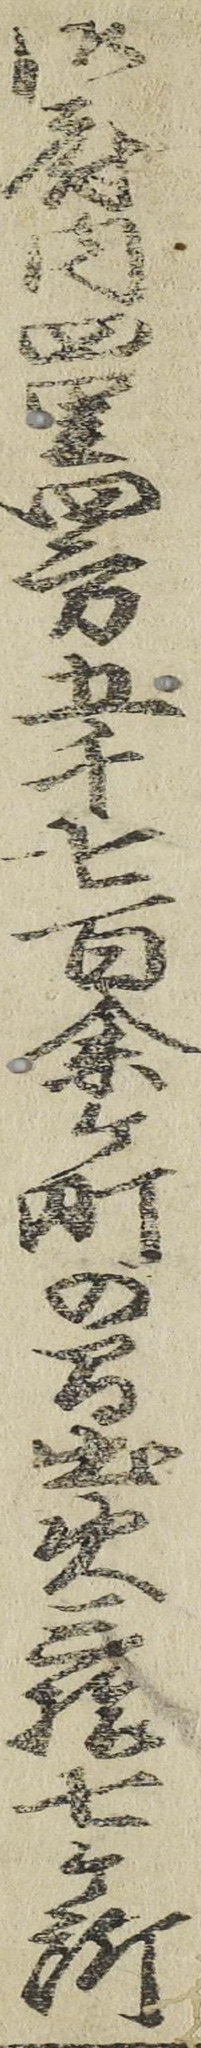御府内四里四方五千七百余ヶ町の間出火三拾七ヶ所
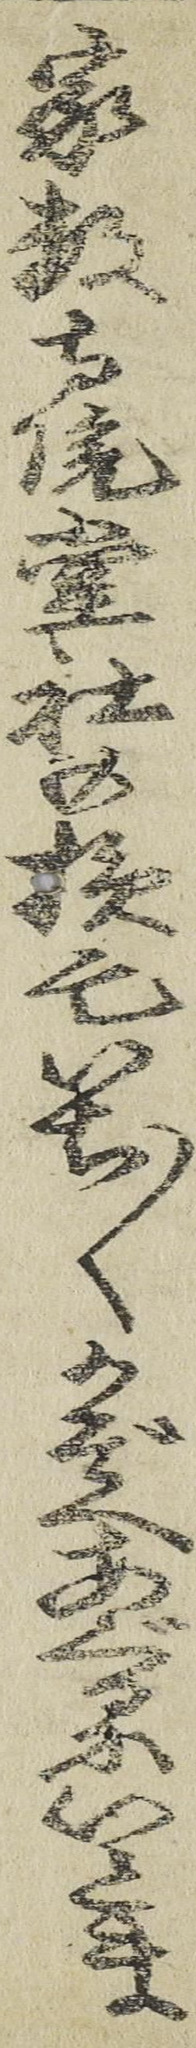家数寺院堂社の損亡いち〳〵かぞへあぐるにいとま
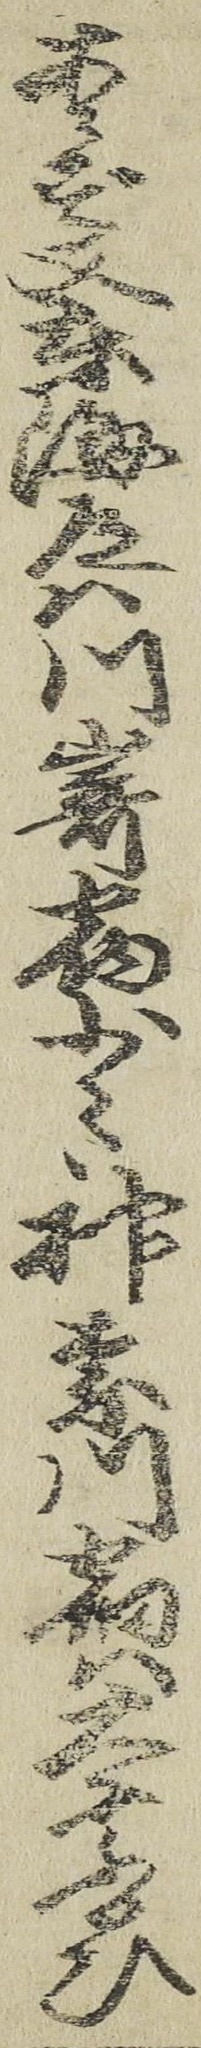あらず又東海道は川崎宿少々神奈川は大にふるひ
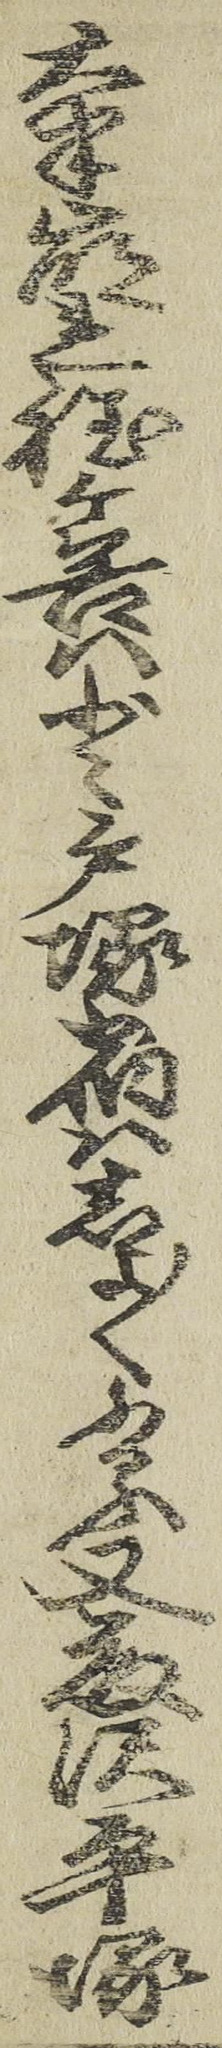大半崩れ程ヶ谷は少々戸塚宿はしよ〳〵ふるふ又藤沢平塚
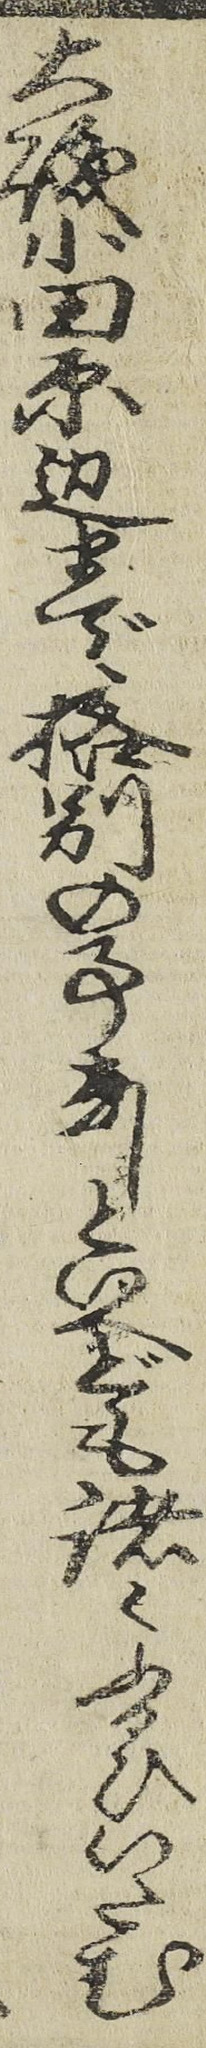大磯小田原辺まで格別の事なしといへども諸々ふるひいたむ
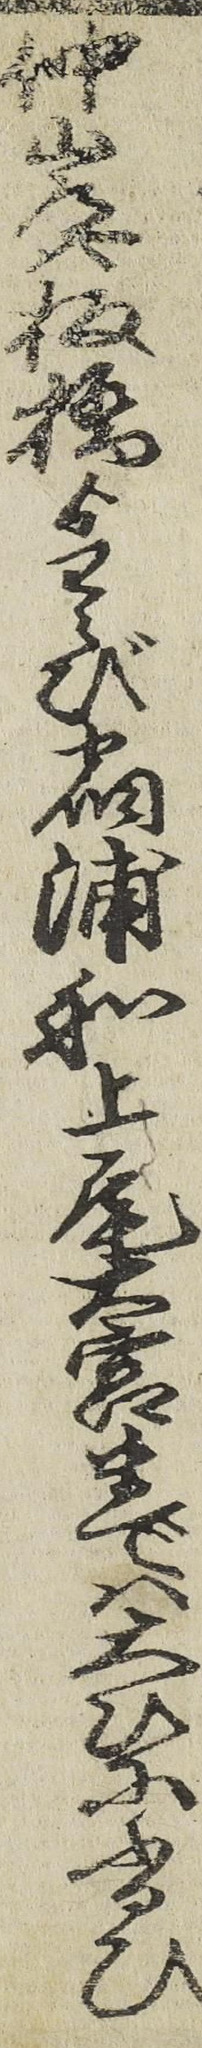仲山道板橋ゟわらび宿浦和上尾大宮までは大ひにふるひ
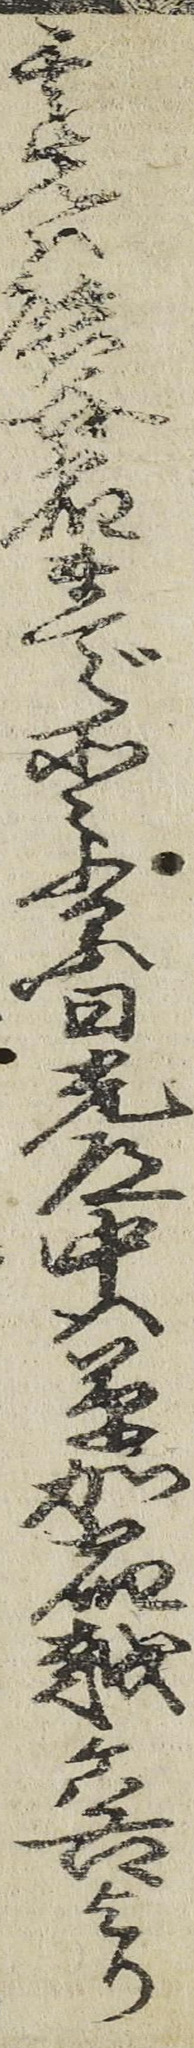其先は熊谷宿まで所々ふるふ日光道中は草加宿越ヶ谷より
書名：安政大地震畧記　全
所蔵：東京大学地震研究所図書室 Earthquake Research Institute Library, The University of Tokyo, JAPAN
